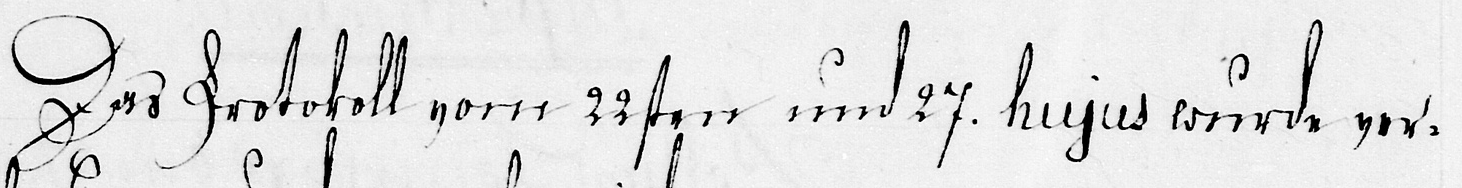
Das Protokoll vom 22sten und 27. hujus wurde ver¬
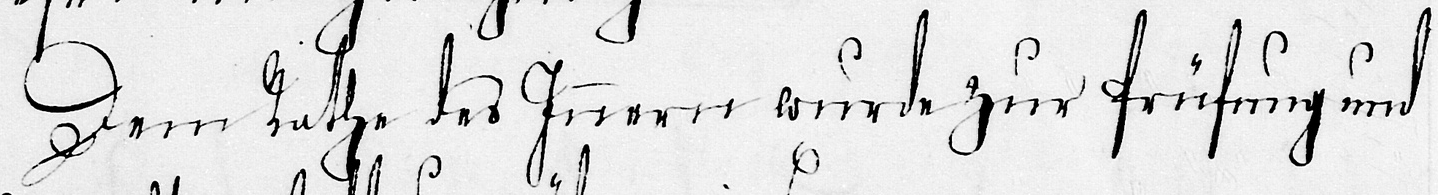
Dem Rathe des Innern wurde zur Prüfung und
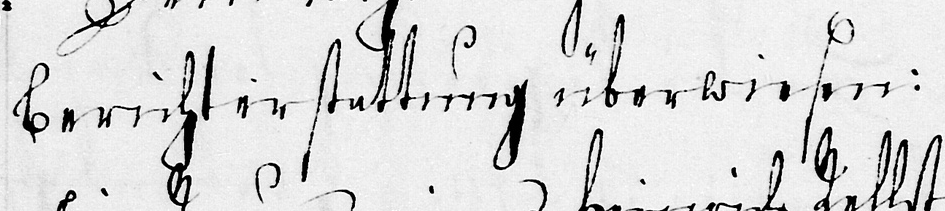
Berichterstattung überwiesen:
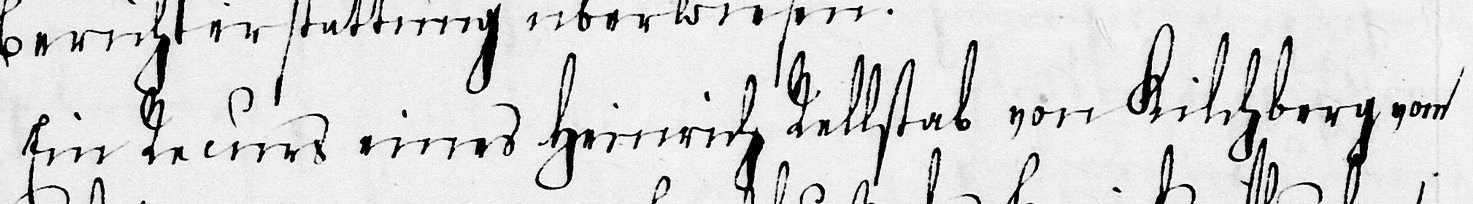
Ein Recurs eines Heinrich Rellstab von Kilchberg vom
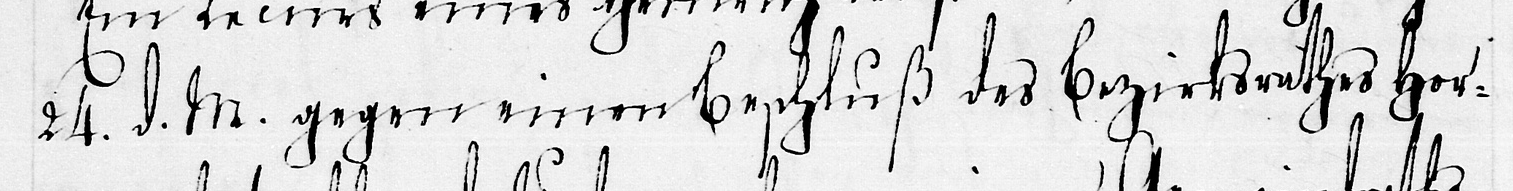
24. d. M. gegen einen Beschluß des Bezirksrathes Hor¬
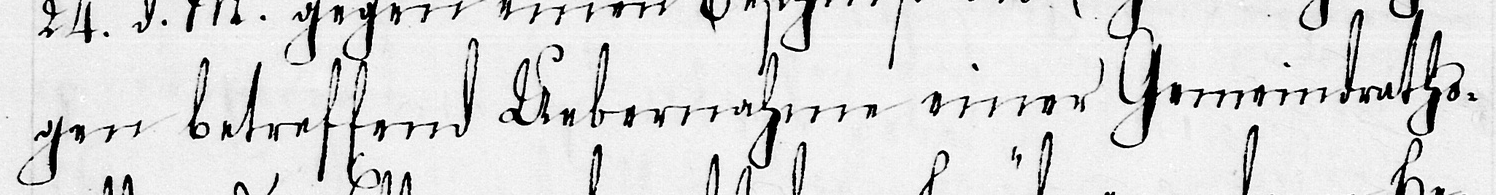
gen betreffend Uebernahme einer Gemeindraths¬
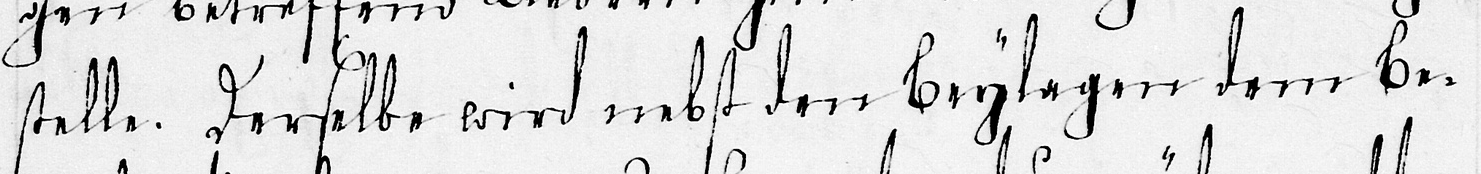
stelle. Derselbe wird nebst den Beylagen dem Be¬
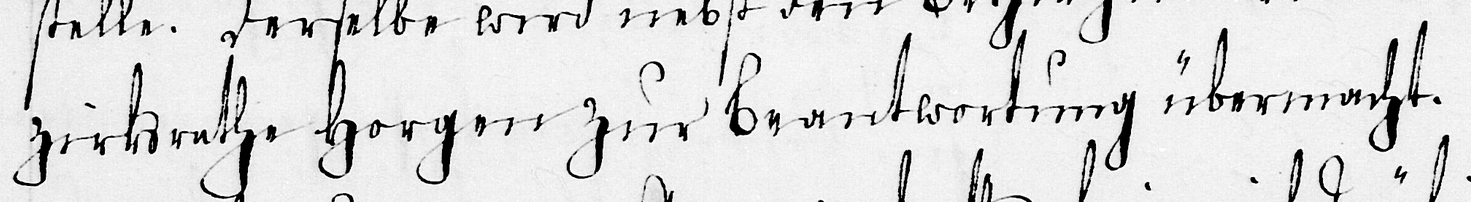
zirksrathe Horgen zur Beantwortung übermacht.
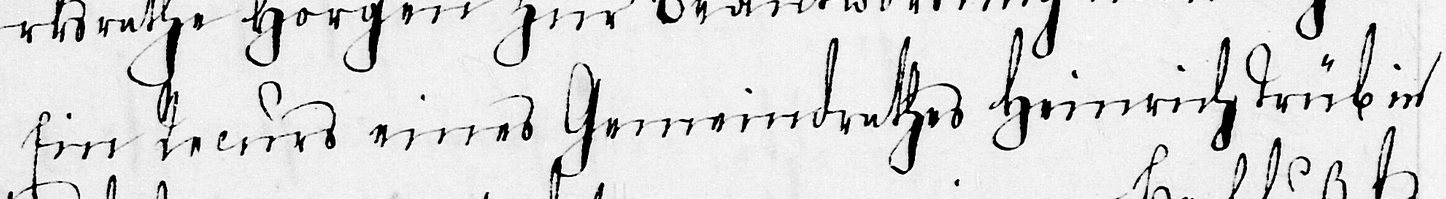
Ein Recurs eines Gemeindrathes Heinrich Trüb in
